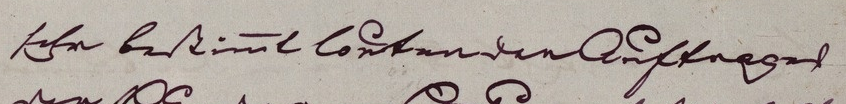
sehr bestimmt lautenden Auftrages
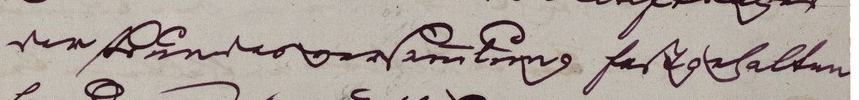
der Bundesversammlung festgehalten
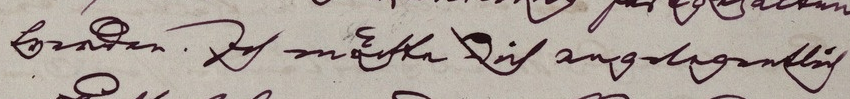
werden. Ich möchte Dich angelegentlich
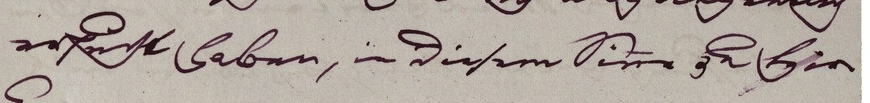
ersucht haben, in diesem Sinne zu wir-
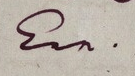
ken.
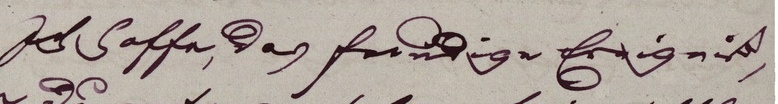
Ich hoffe, das freudige Ereigniß,
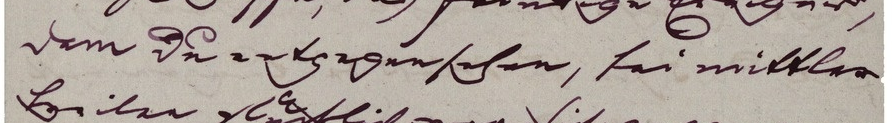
dem Du entgegensehen, sei mittler-
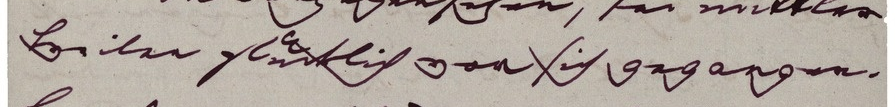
weilen glücklich vor sich gegangen.
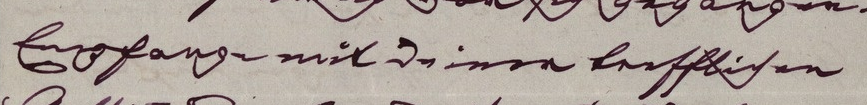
Empfange mit Deiner trefflichen
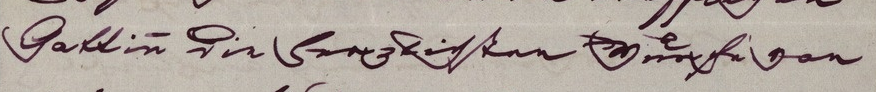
Gattinn die herzlichsten Wünsche von
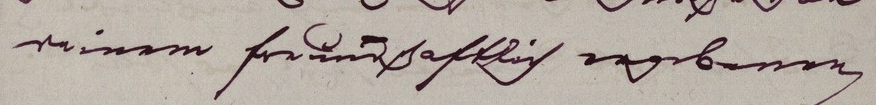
Deinem freundschaftlich ergebenen
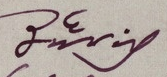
Zürich
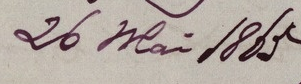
26 Mai 1865
